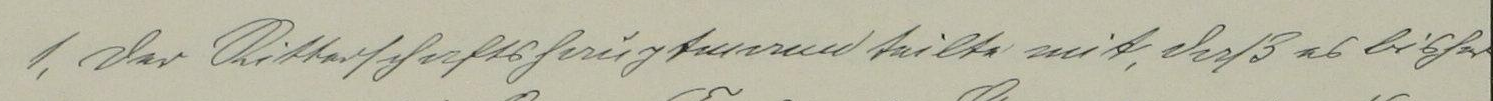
1. Der Ritterschaftshauptmann teilte mit, daß es bisher
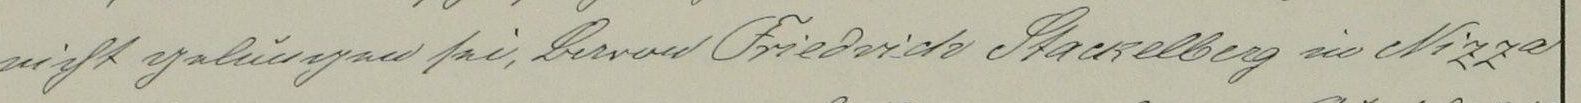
nicht gelungen sei, Baron Friedrich Stackelberg in Nizza
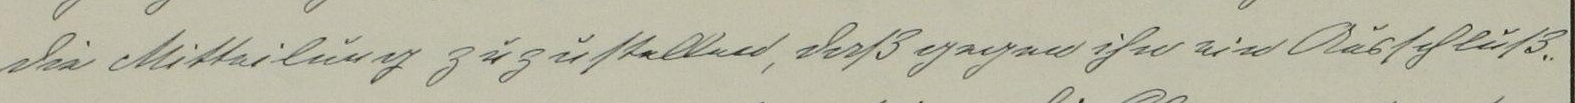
die Mitteilung zuzustellen, daß gegen ihn ein Ausschluß-
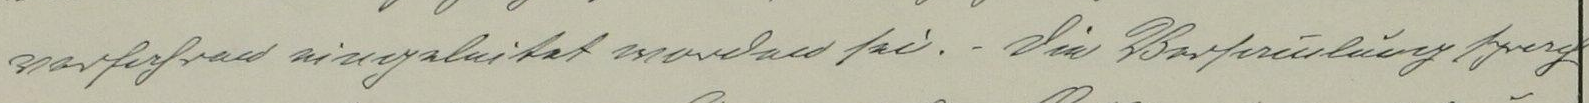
verfahren eingeleitet worden sei. - Die Versammlung sprach
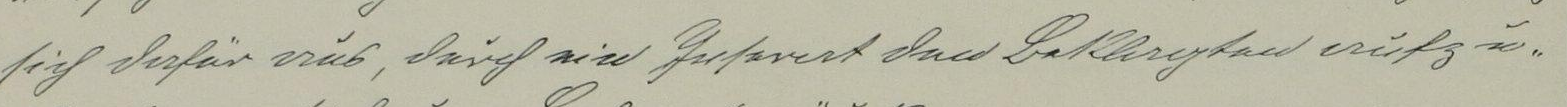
sich dafür aus, durch ein Inserat den Beklagten aufzu-
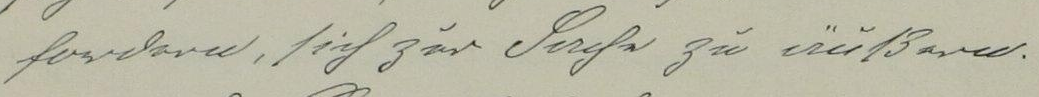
fordern, sich zur Sache zu äußern.
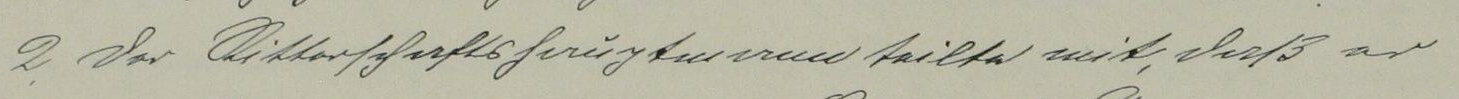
2. Der Ritterschaftshauptmann teilte mit, daß er
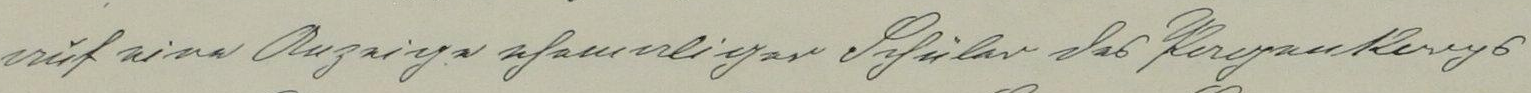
auf eine Anzeige ehemaliger Schüler des Pagenkorps
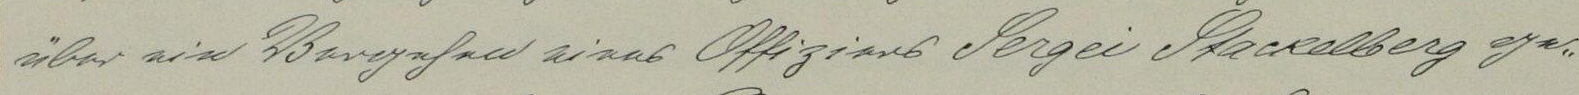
über ein Vergehen eines Offiziers Sergei Stackelberg ge-
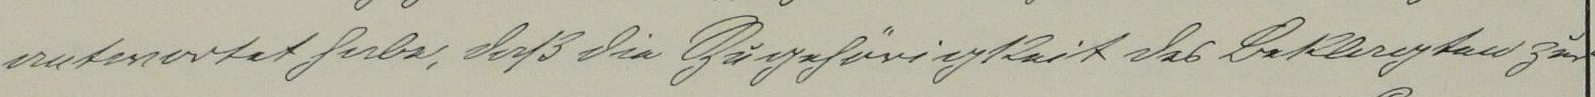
antwortet habe, daß die Zugehörigkeit des Beklagten zur
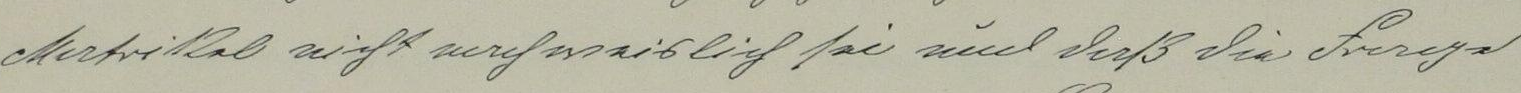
Matrikel nicht nachweislich sei und daß die Frage
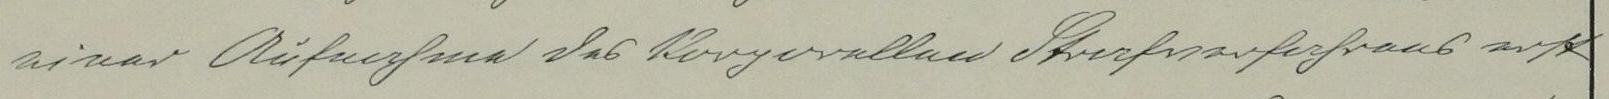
einer Aufnahme des korporellen Strafverfahrens erst
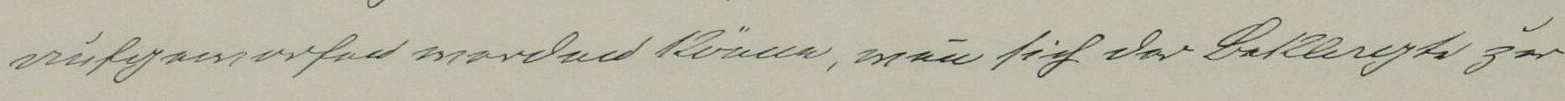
aufgeworfen werden könne, wenn sich der Beklagte zur
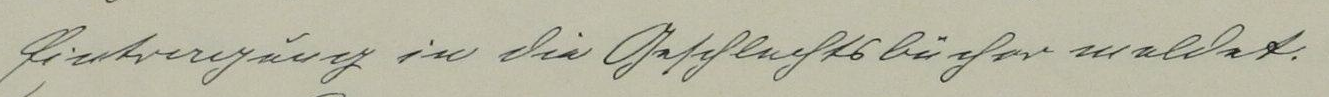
Eintragung in die Geschlechtsbücher meldet.
